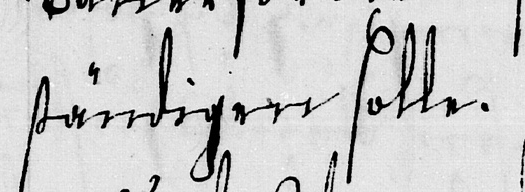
ständigen solle.
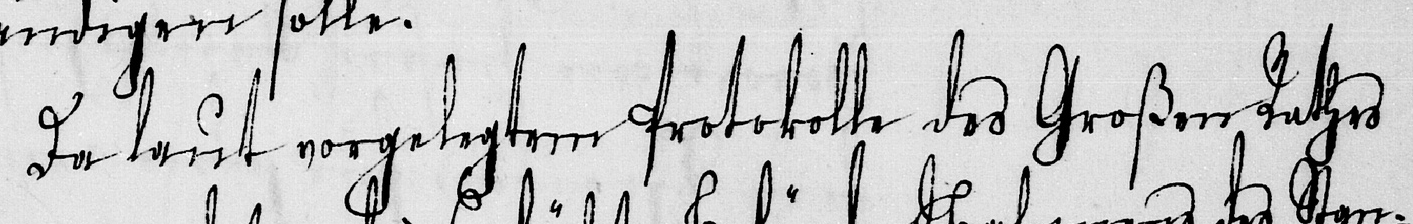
Da laut vorgelegtem Protokolle des Großen Rathes
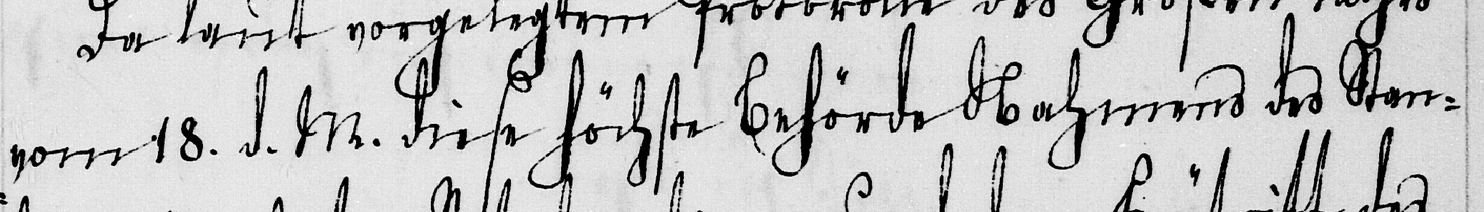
vom 18. d. M. diese Höchste Behörde Nahmens des Stan¬
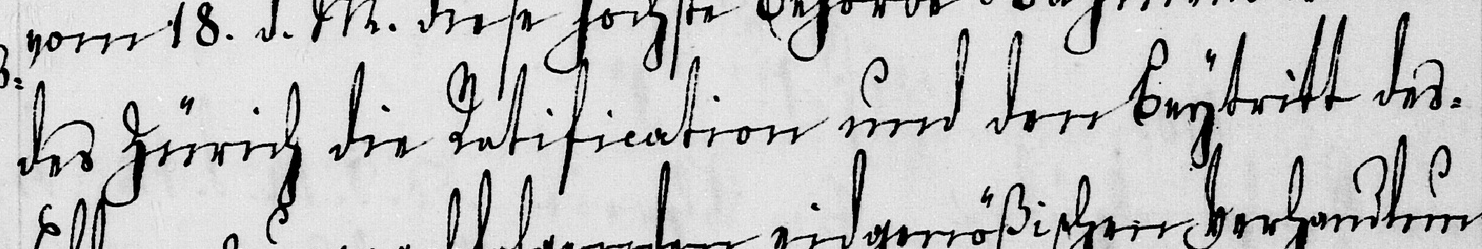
des Zürich die Ratification und den Beytritt des¬
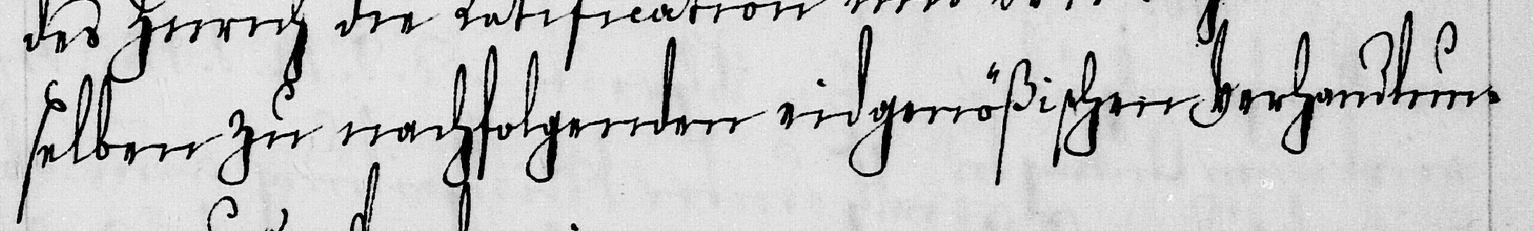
selben zu nachfolgenden eidgenößischen Verhandlun¬
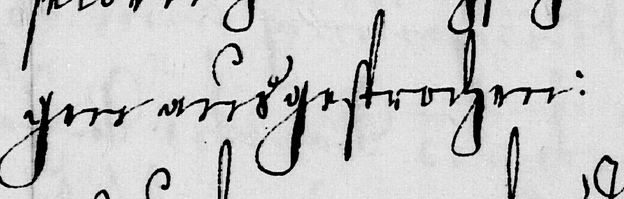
gen ausgesprochen:
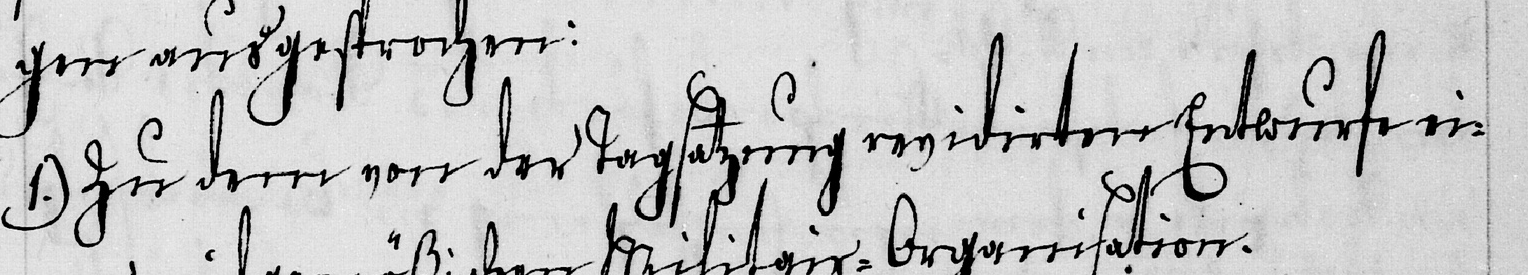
1.) Zu dem von der Tagsatzung revidirten Entwurfe ei¬
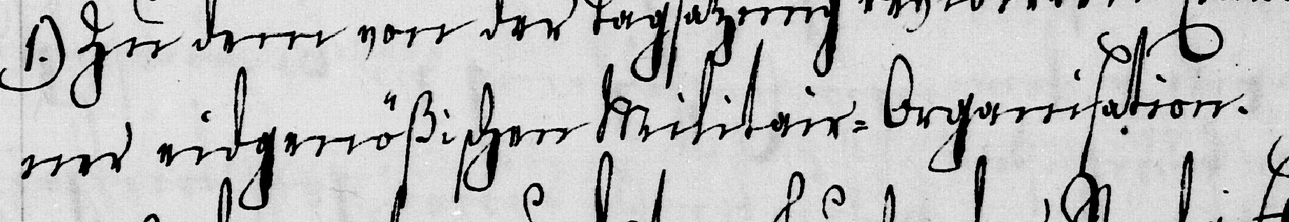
ner eidgenößischen Militair-Organisation.
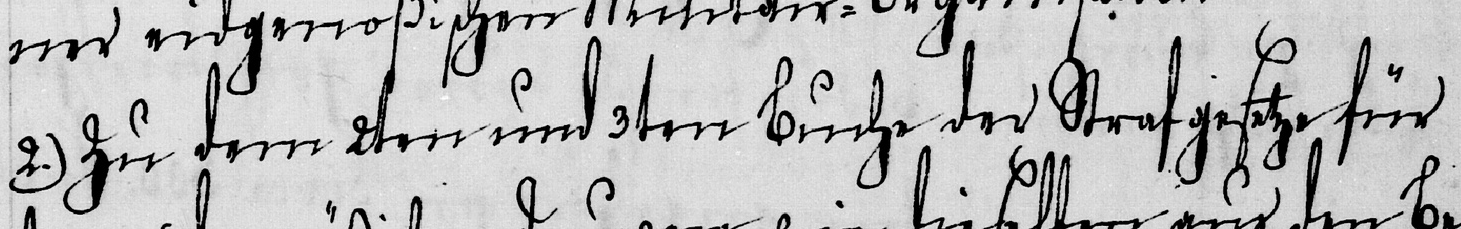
2.) Zu dem 2ten und 3ten Buche der Strafgesetze für
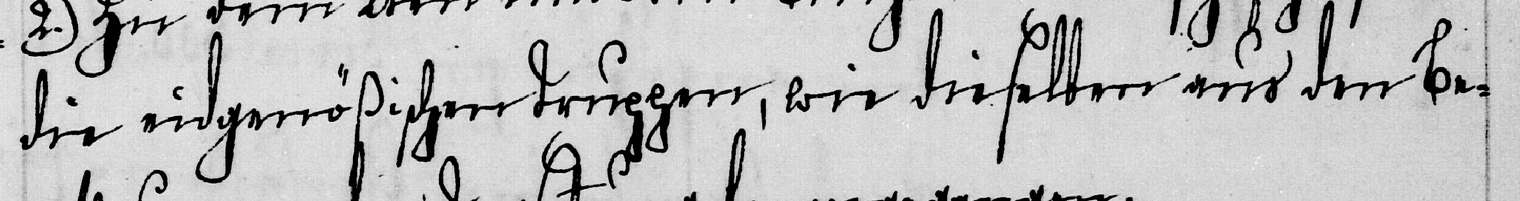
die eidgenößischen Truppen, wie dieselben aus den Be¬
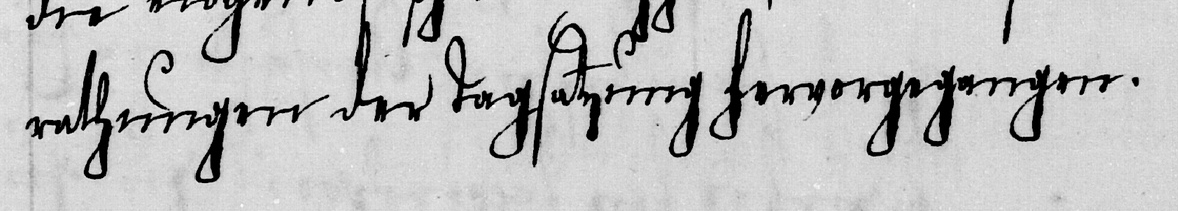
rathungen der Tagsatzung hervorgegangen.
